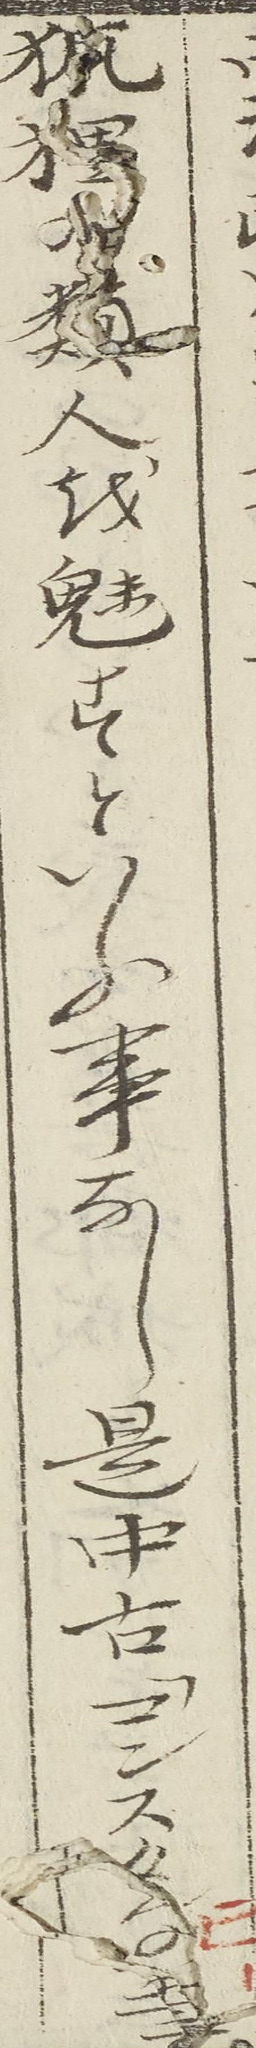狐狸の類に人を魅すといふ事なし是中古「コンスタン」
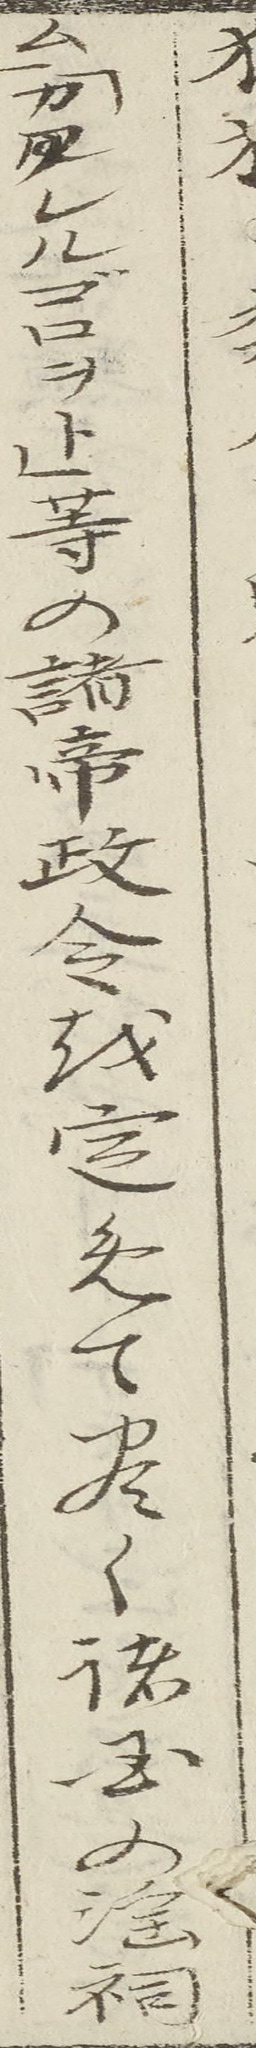ム」「カタレゴロヲト」等の諸帝政令を定めて巻く諸国の淫祠
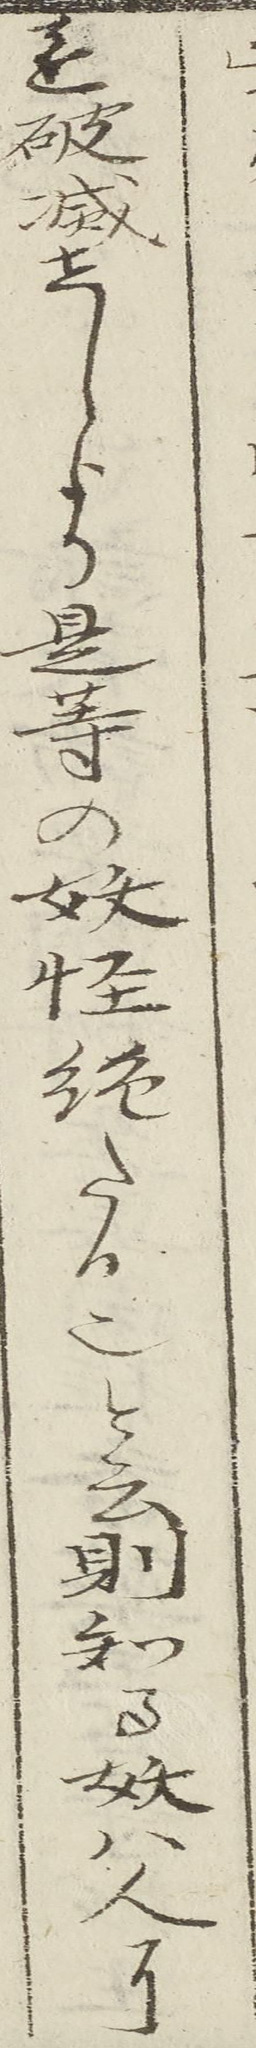を破滅せしより是等の妖怪絶たる也と云則知る妖ハ人に
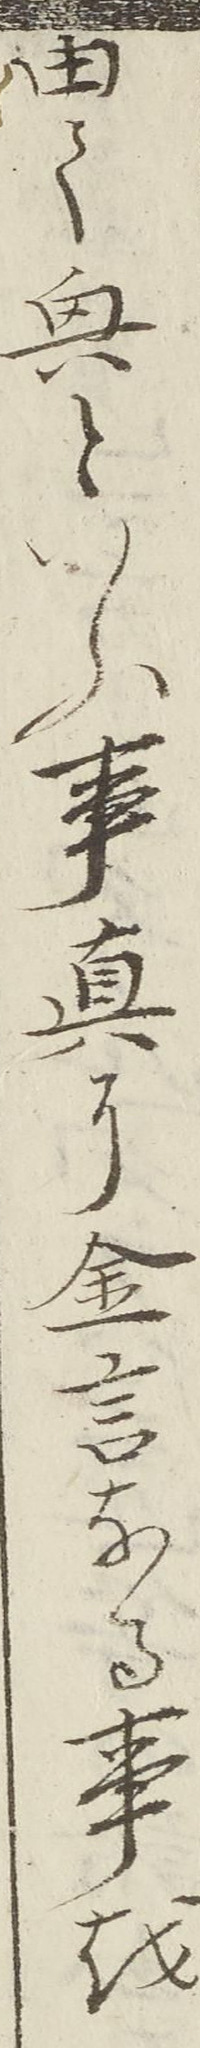由て奥といふ事真に金言なる事を
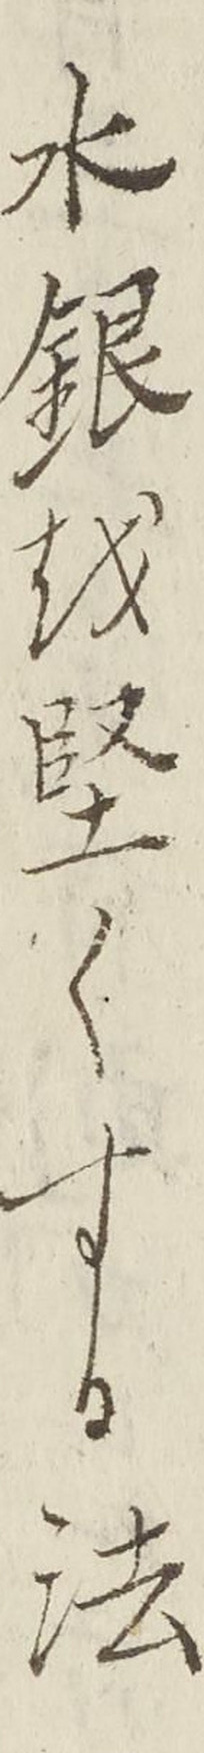水銀を堅くする法
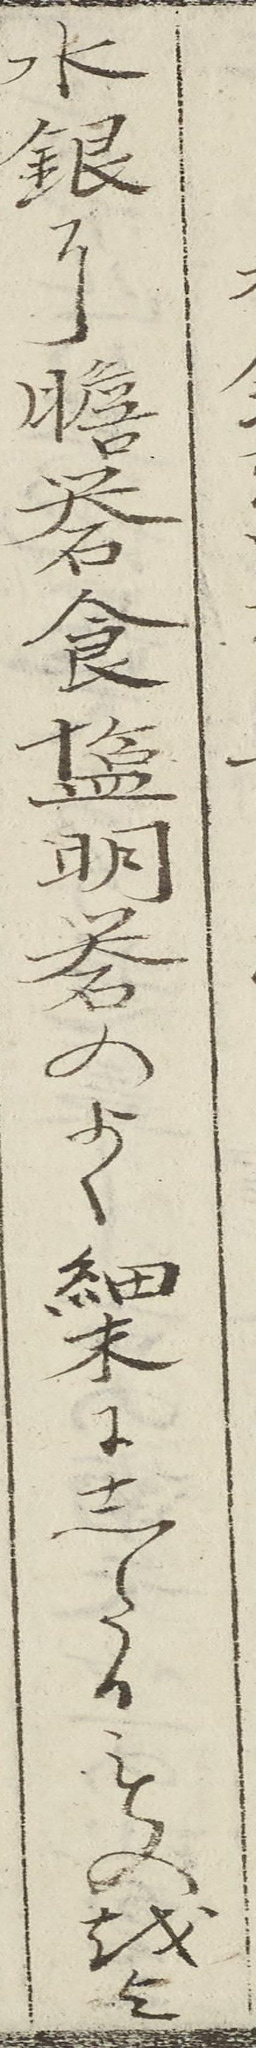水銀に膽礬食塩明礬のよく細未にしたるものをよ
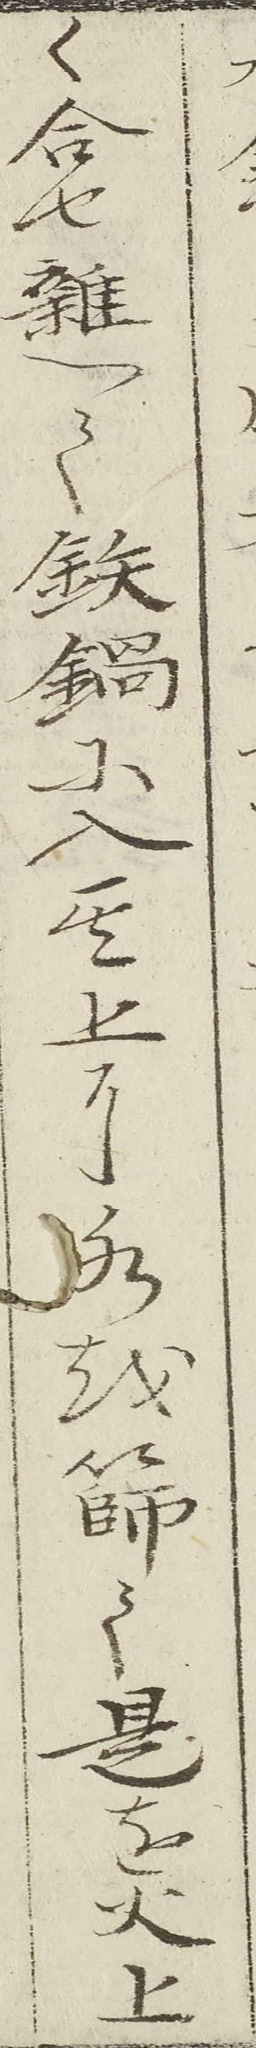く合せ雑へて鉄鍋に入其上に水を篩て是を火上
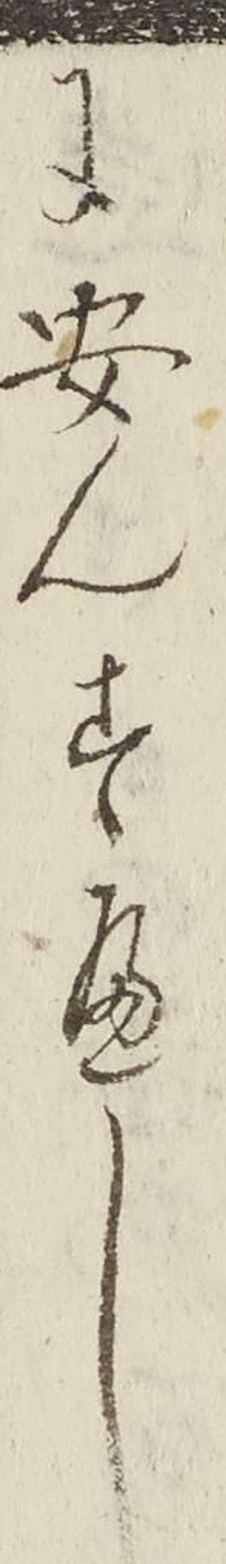に安んすへし
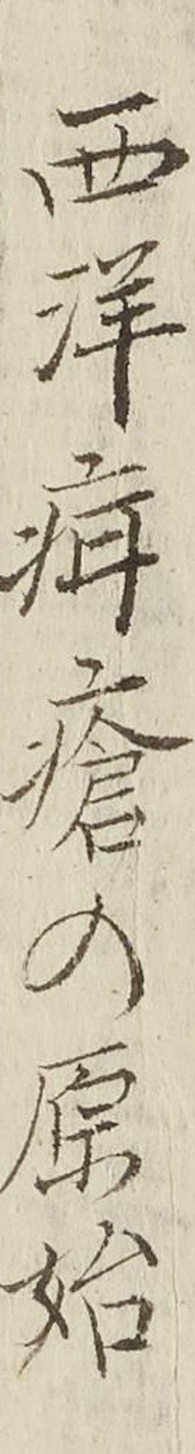西洋疽瘡の原始
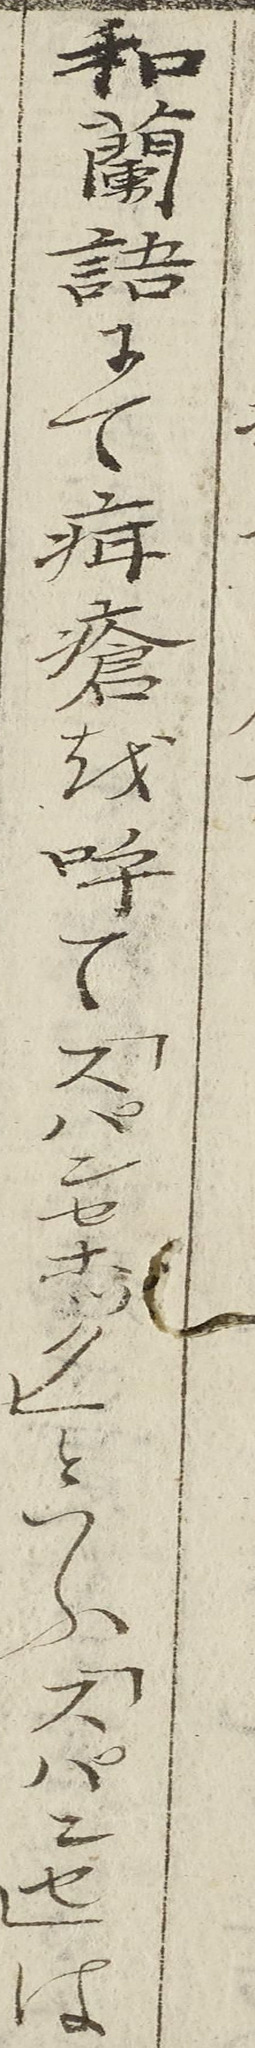和蘭語にて疽瘡を呼て「スパンセホック」といふ「スパンセ」は
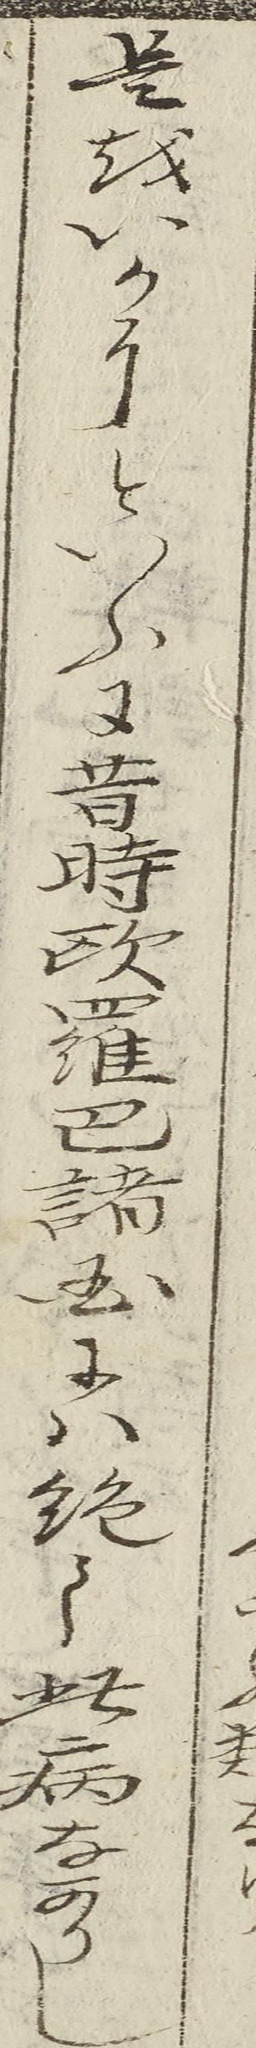是をいかにといふに昔欧羅巴諸国にハ絶て此病なかりし
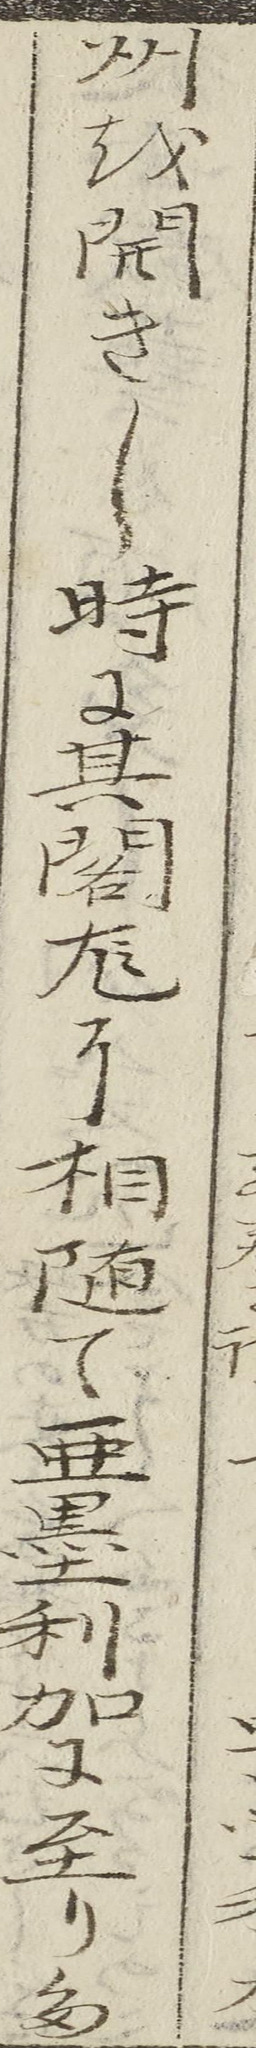州を開きし時に其閣老に相随て亜墨利加に至り多
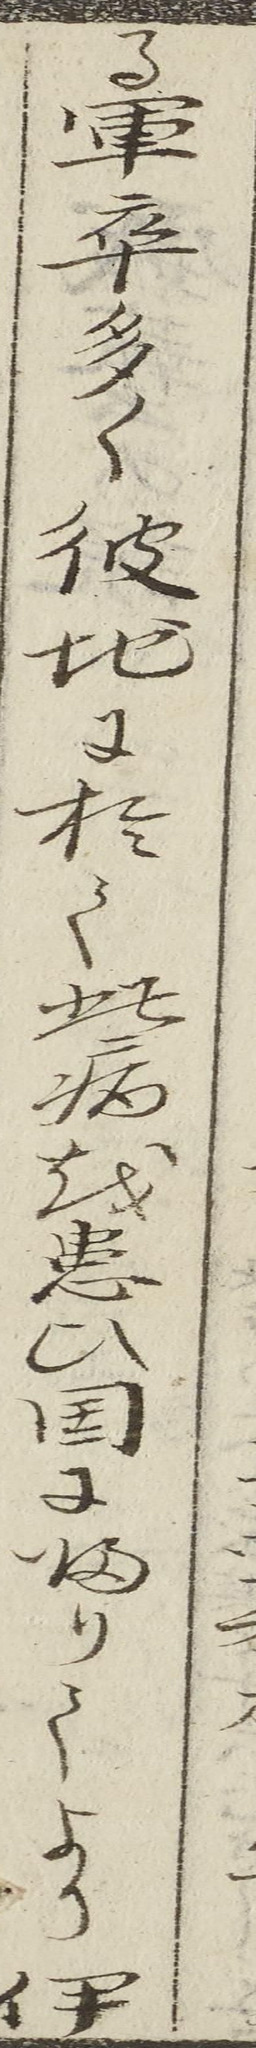る軍卒多く彼地に於て此病を患ひ国に帰りてより伊
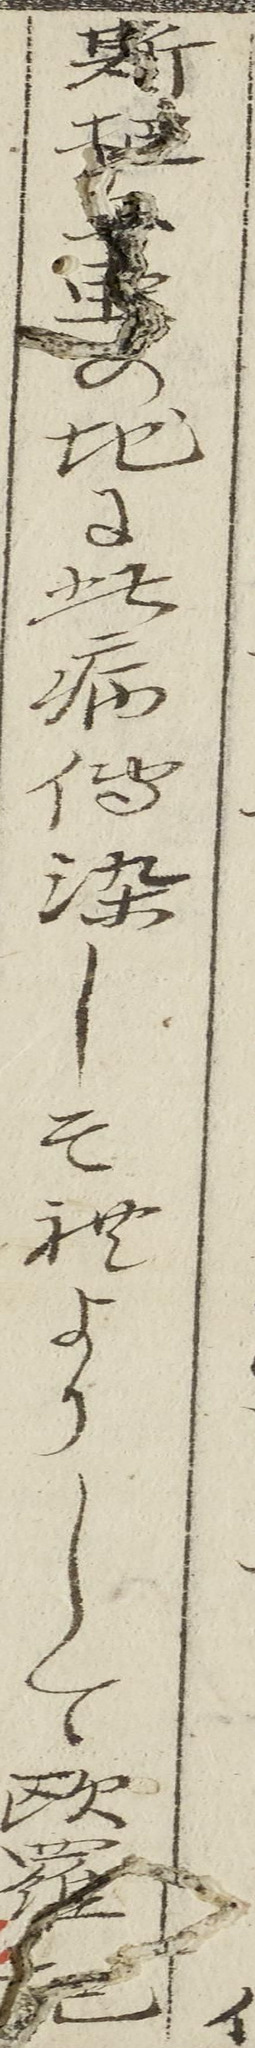斯把尓亜の地に此病伝染しそれよりして欧羅巴
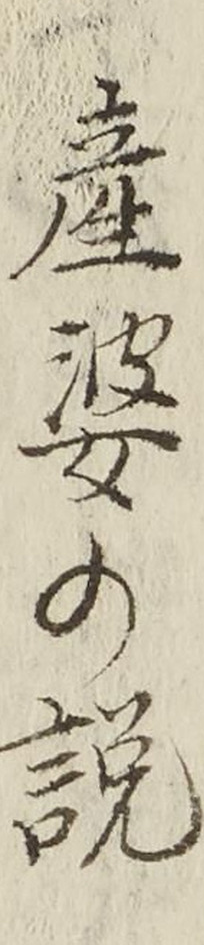産婆の説
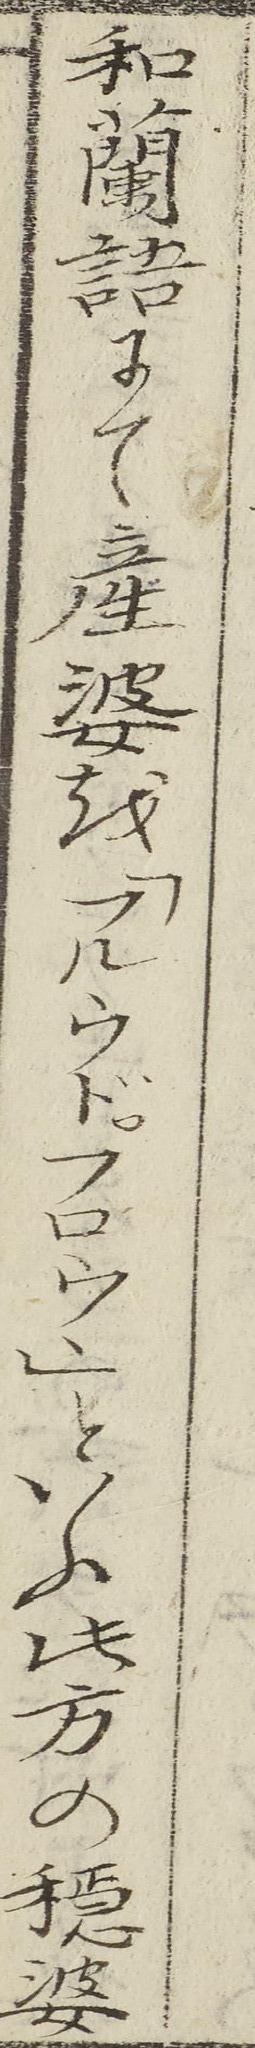和蘭語にて産婆を「フルウド。フロウ」といふ此方の穏婆
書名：西洋雜記　坤
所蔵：東京大学地震研究所図書室 Earthquake Research Institute Library, The University of Tokyo, JAPAN
